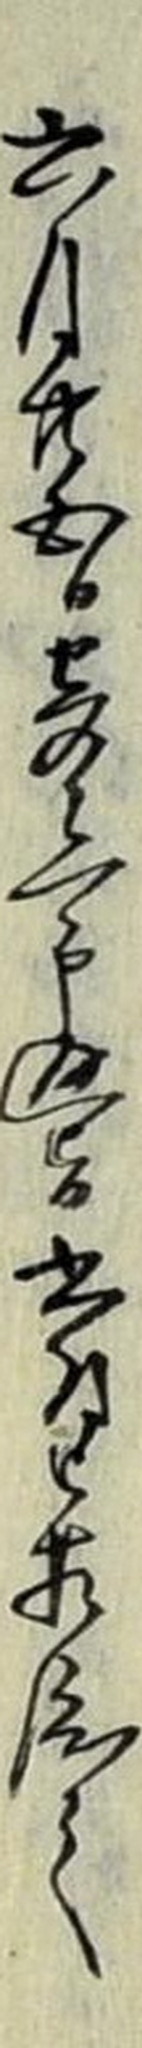六月廿五日寄々可申通旨書付被相渡之
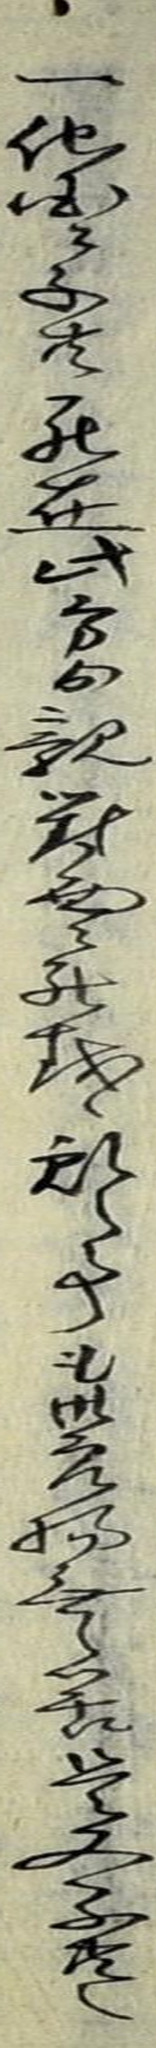一他国ニ子共罷在此方ゟ親対面ニ罷越候願之事も取揚無之筈是又子共之
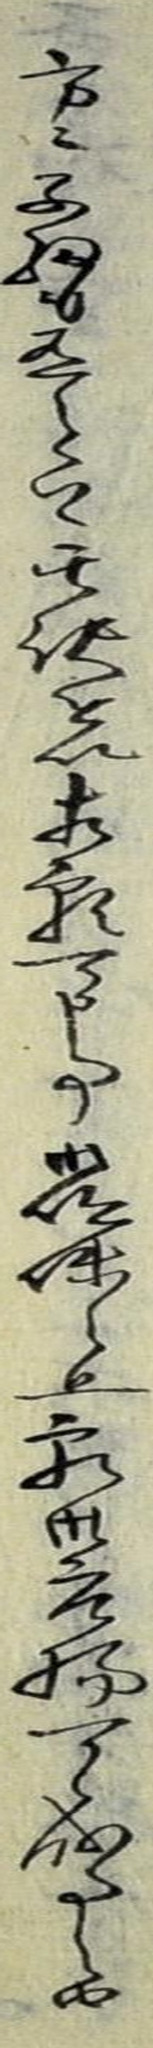方ニ子細も有之候ハヽ其訳を以相願可申事御吟味之上願御取揚可被成事之由
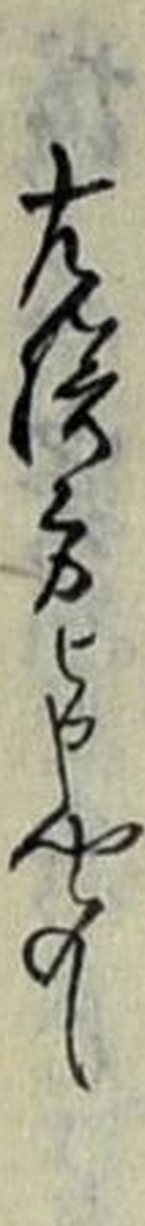左膳方被申聞候
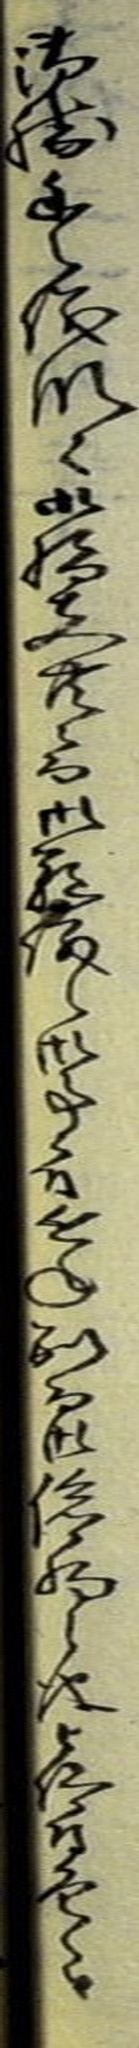〇御勝手之儀段々御指支共ニ而御難儀之御事ニ付近年別而御倹約之儀被仰付色々之
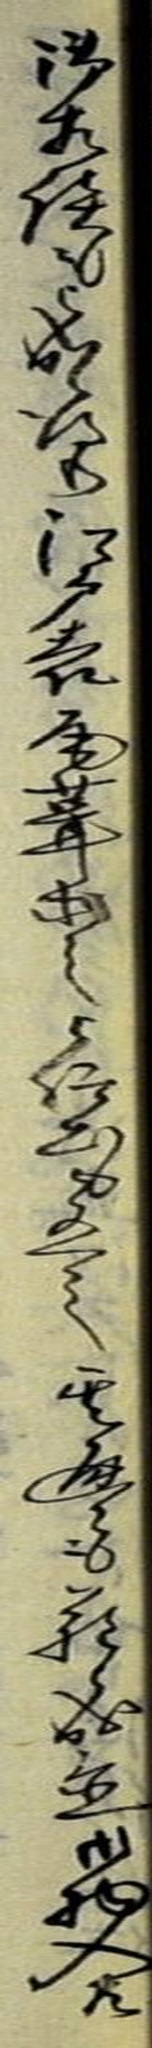御相談も被成候得共江戸表瓦葺等之被仰出も有之其通ニも難被成置御物入共
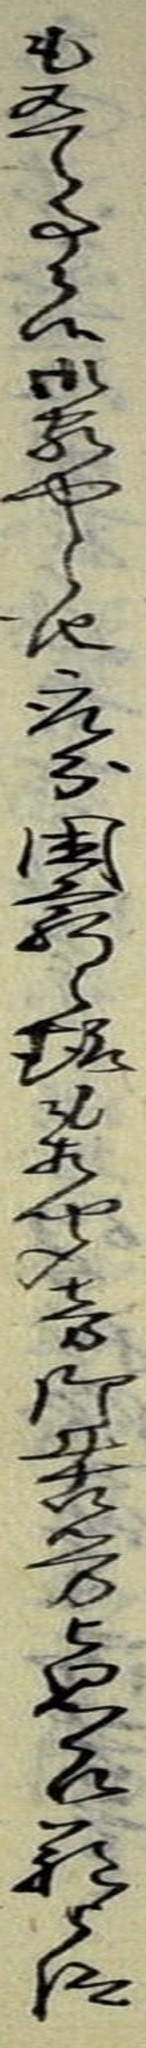も有之事ニ候御家中之儀取分困窮之趣も相聞旁御苦労被思召難被仰
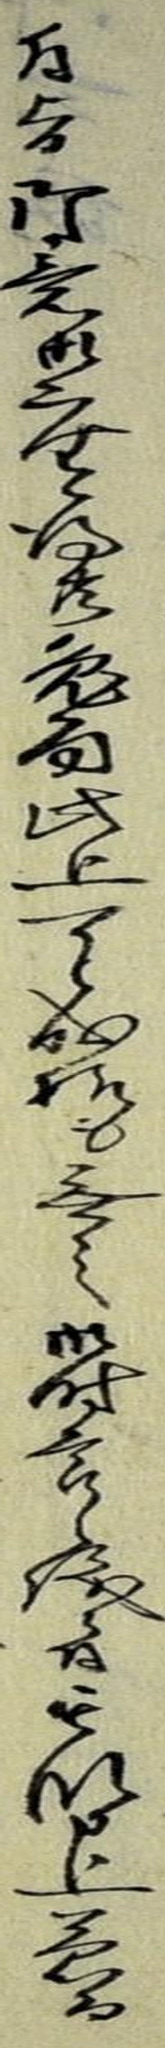付旨御意御座候得共兎角此上可被成様も無之御時節之儀ニ付其段申上兼而
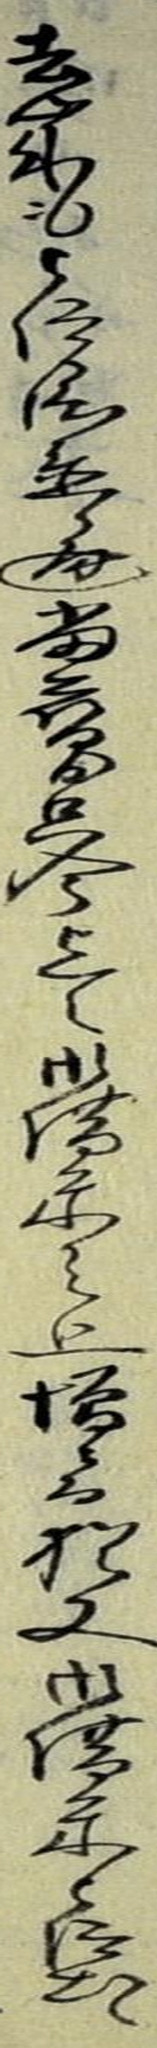去歳も被仰渡置候通当暮ゟ只今迄之御借米之上増ニ而猶又御借米被仰出候
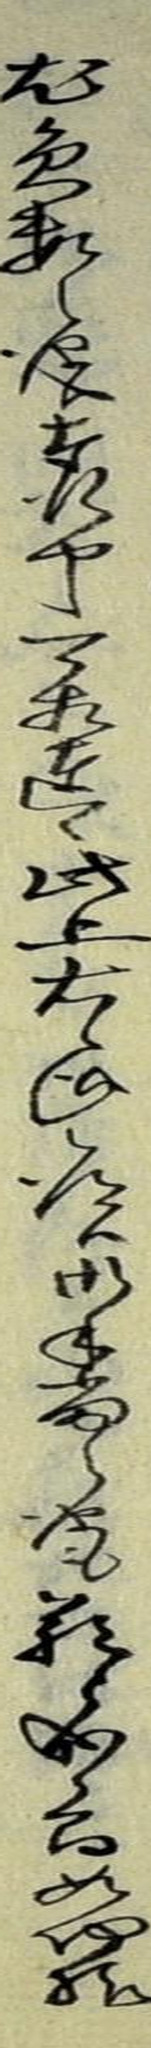尤員数之儀ハ奉行中可相達候此上右之趣候得ハ御手当之儀も難被成候間如何様
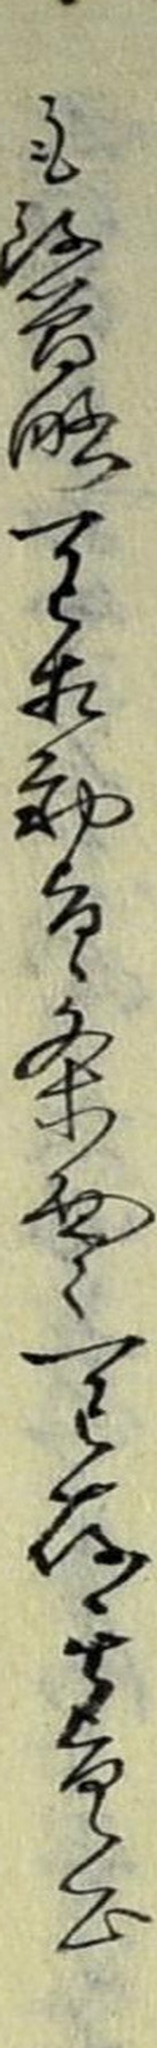ニも致簡略可被相勤旨候条面々可被存其旨候以上
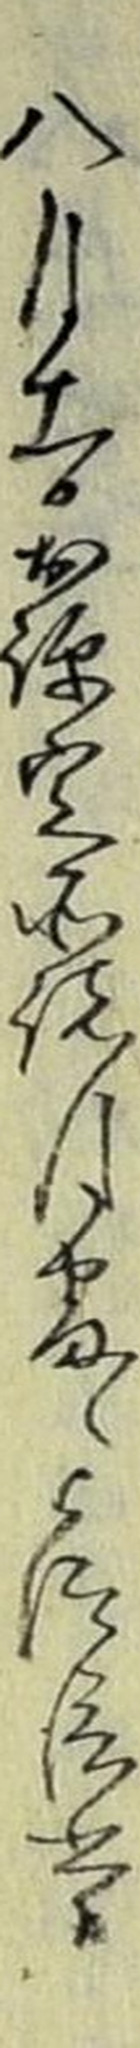八月十一日於評定所諸月番へ被仰渡書付
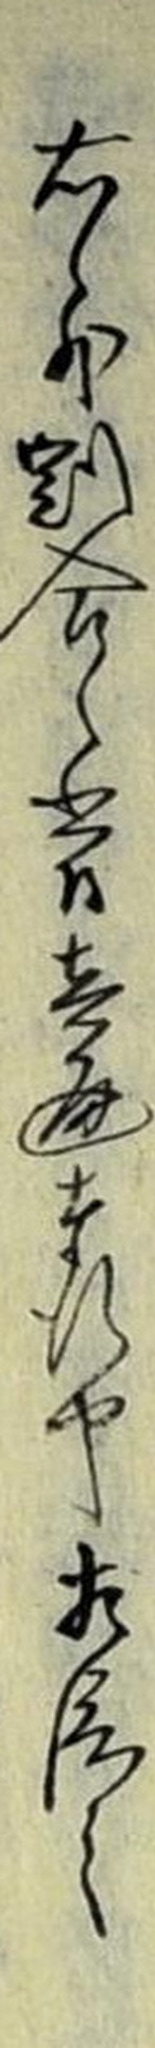右之外割合之書付壱通奉行中相渡之
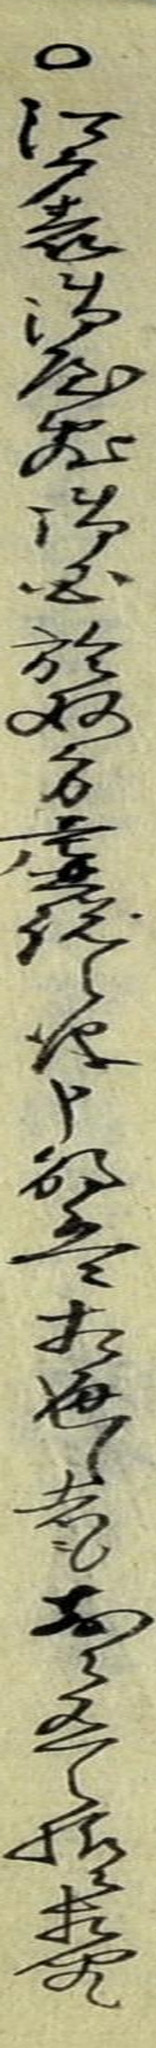〇江戸表御屋敷御国於双方虚説之儀申触又々？相通し者も前々有之様ニ相聞候
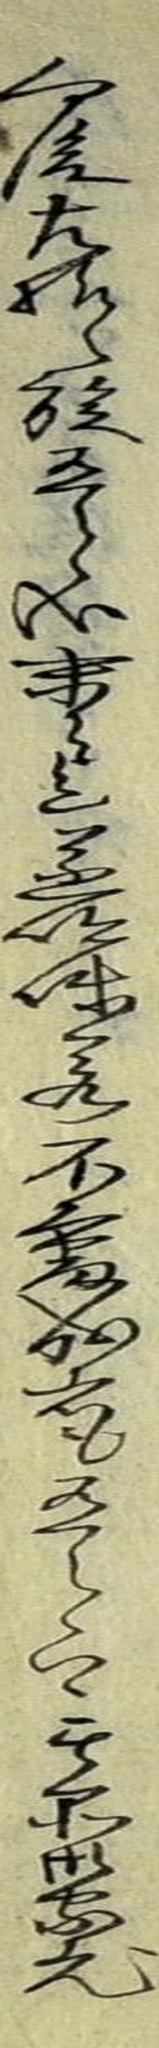向後左様之族有之候哉末々迄遂吟味若不審成者も有之候ハヽ其品御家老
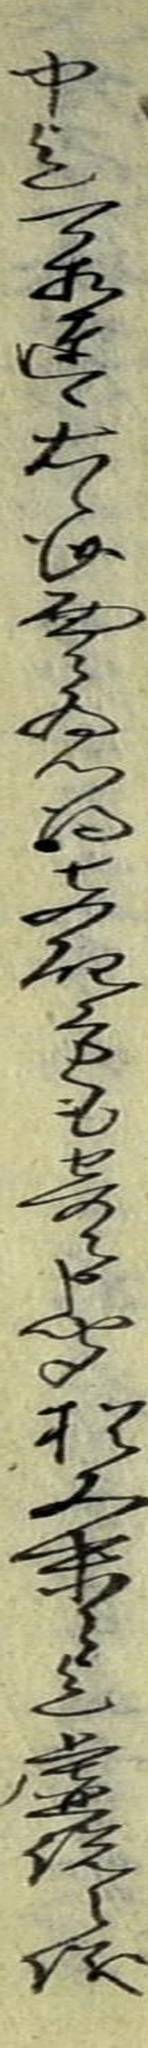中迄可相達候右之趣面々為心得支配方へも寄々申聞猶又末々迄虚説之儀
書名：命令之部 一
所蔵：福井県文書館 Fukui Prefectural Archives
